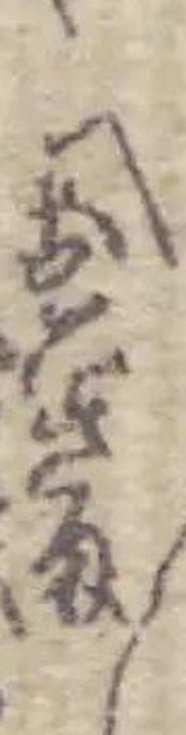〽おこさま
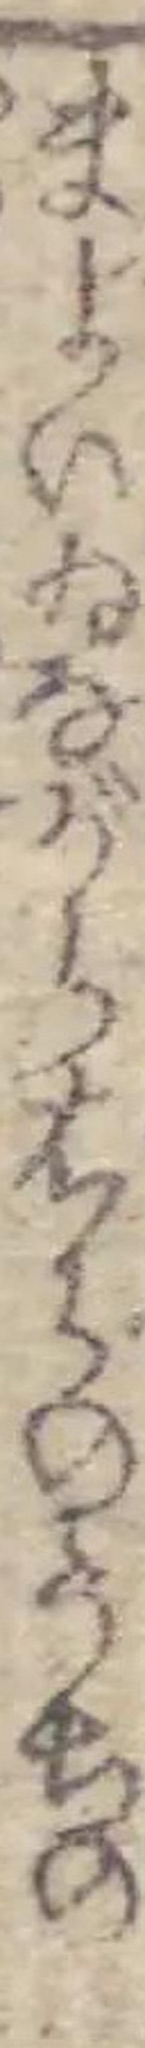まよいゐながらはらのうちの

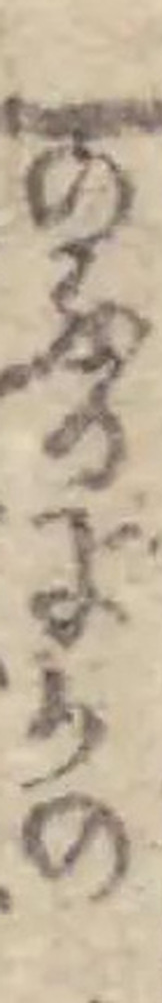のふるよかの
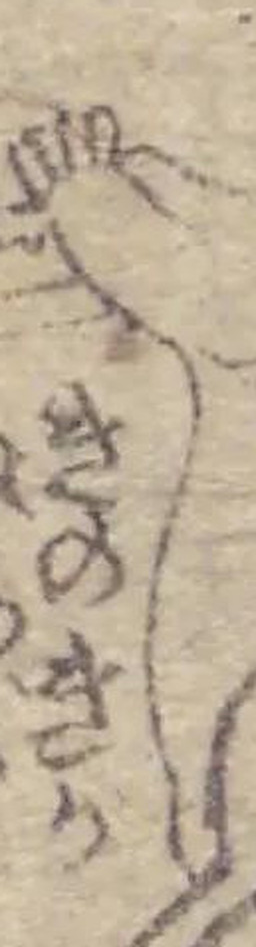きのきか
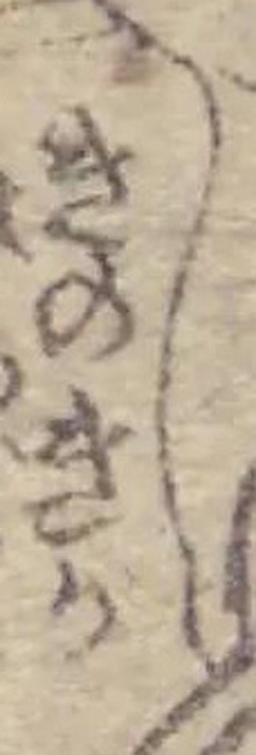きのきか
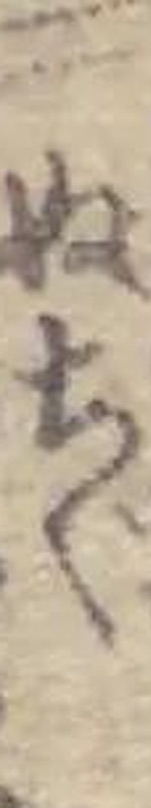ぬちく
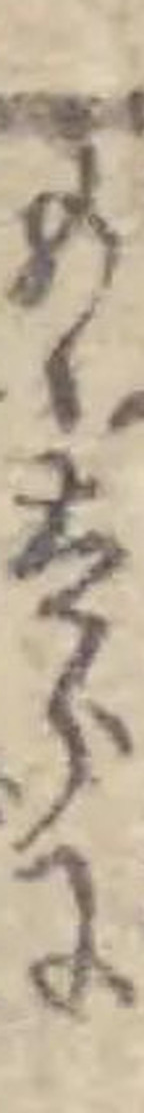もゝ太郎に
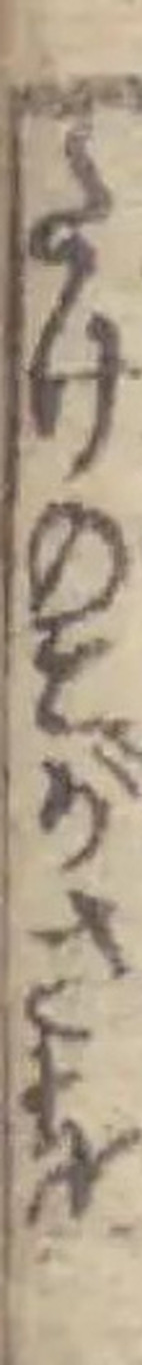たけのこがさを
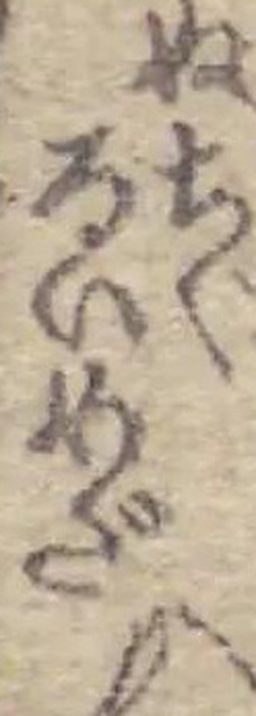るいめだ
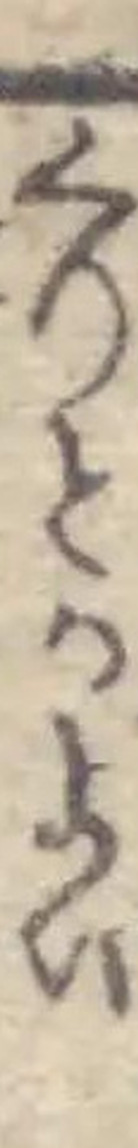くりとかよい
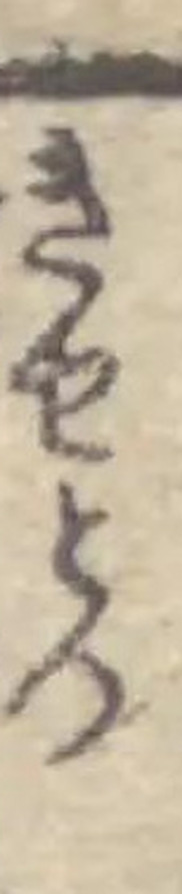きせとつ
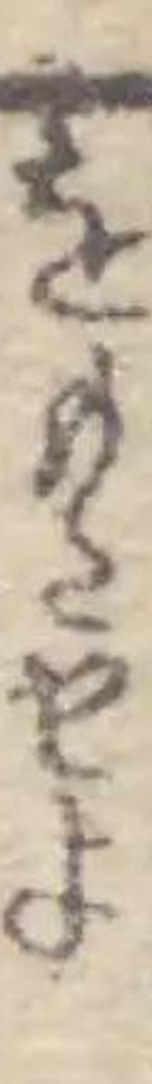をもたせよ
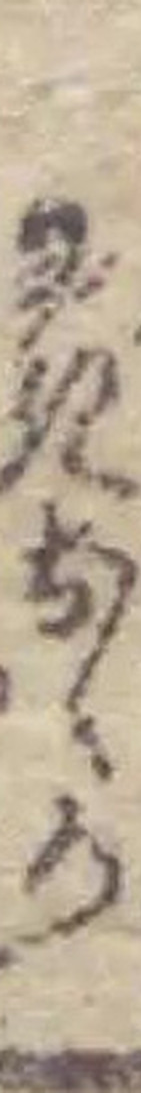やきおゝか
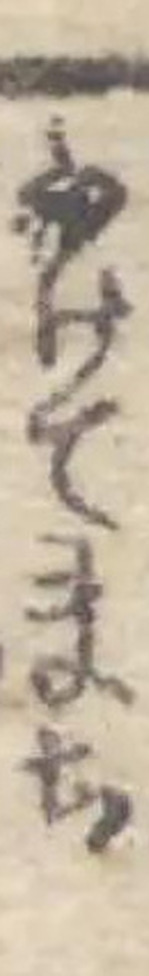ふけてまち
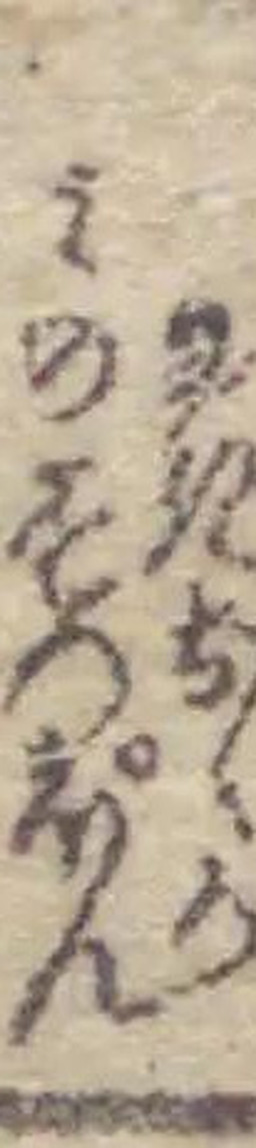みのすつぽん
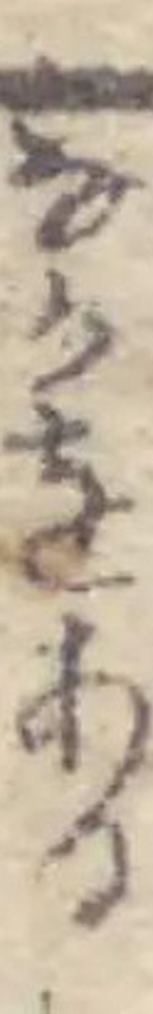なかをある
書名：化物尽 4巻
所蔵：国立国会図書館 National Diet Library, JAPAN
